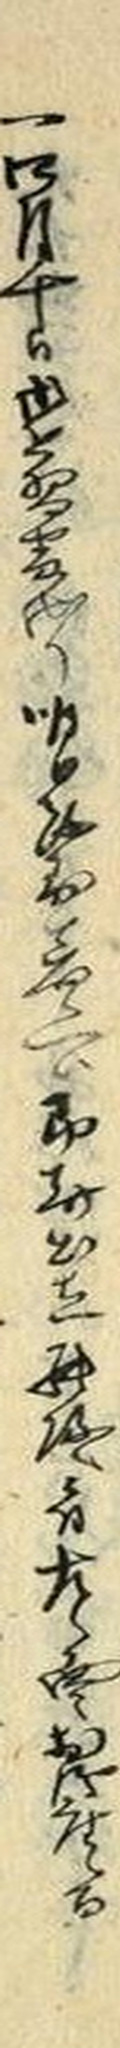一四月十日御近習番代り明日致到着候へは即刻出立罷帰候ニ付左之面々於御座之間
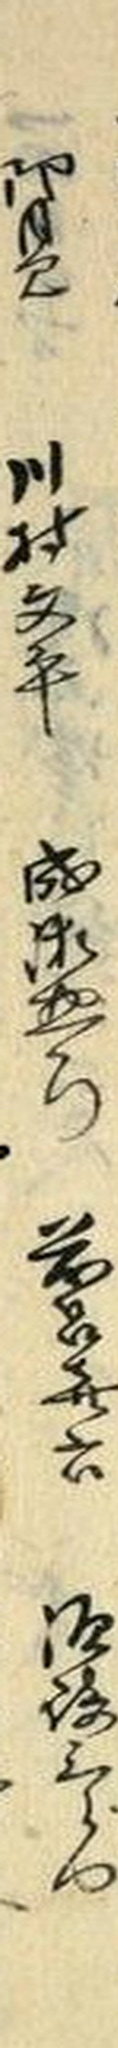御目見川村文平成瀬惣右衛門茂呂喜六須崎三郎右衛門
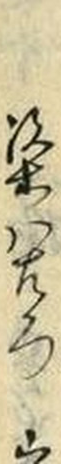沢木八左衛門
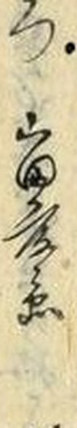山田藤兵衛
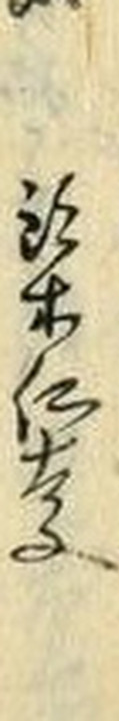鈴木仁太夫
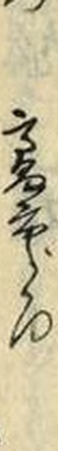高畠市郎右衛門
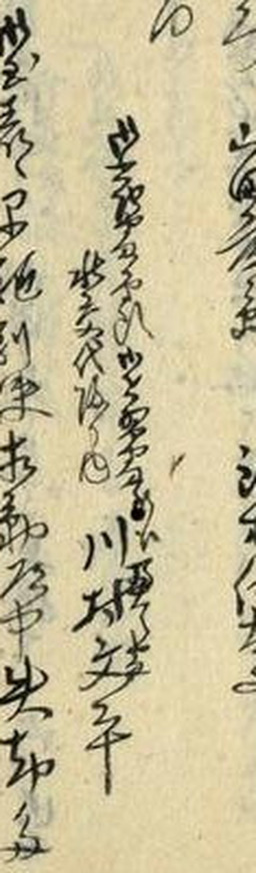金二両御書院番筆頭御近習番頭取奥之番
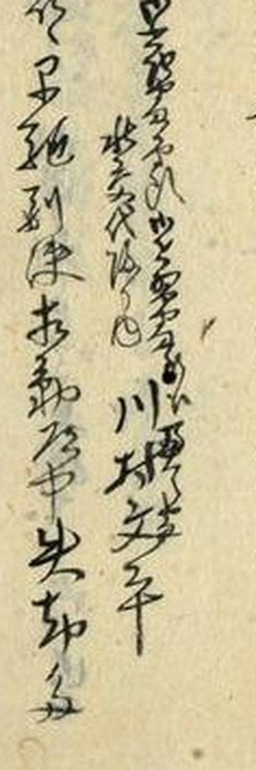秋交代帰り内川村文平
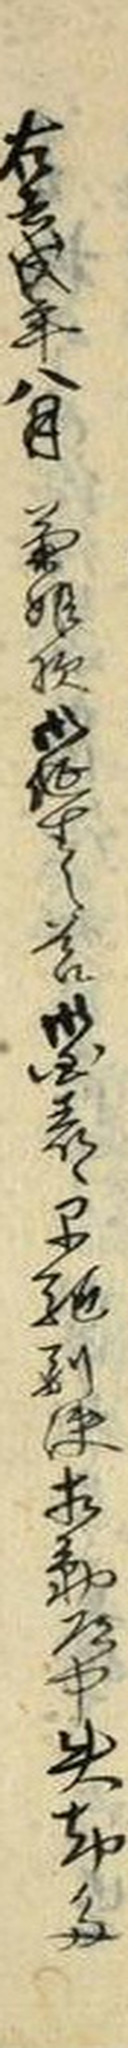右去戌年八月菊姫様御誕生之節御国表へ早駆副使相勤道中失却多

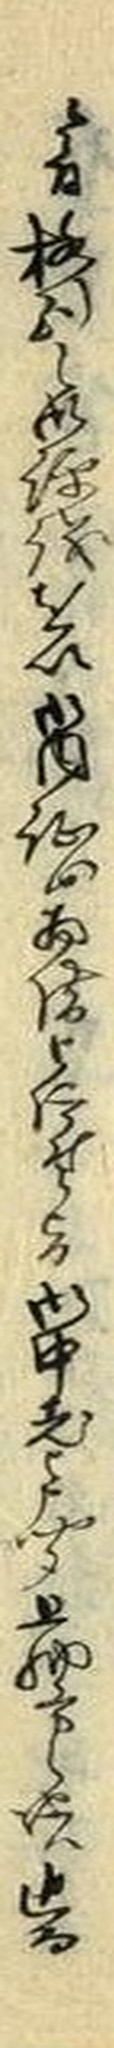ニ付格別之御評議を以御内証ゟ拝借被仰付候旨御中老被申聞且納方之儀ハ追而
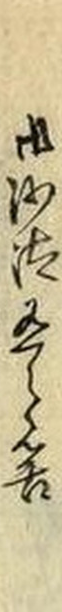御沙汰有之候筈
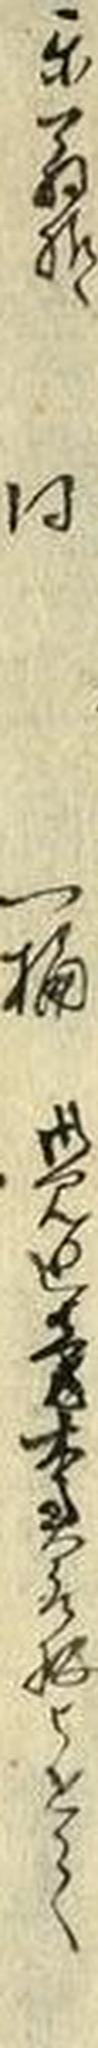楽翁様へ同一桶御見廻方大奥取扱被進之
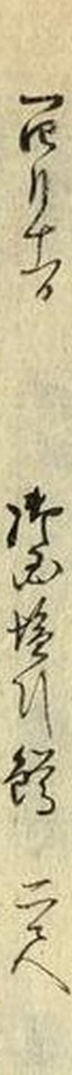一四月十一日御国塩引鱒二尺
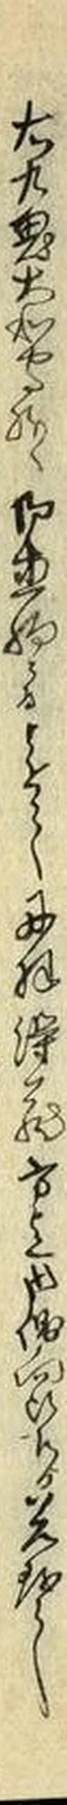右九鬼大和守様へ御直物ニ付被進之丹羽蔵方迄御側向頭取ゟ差越之
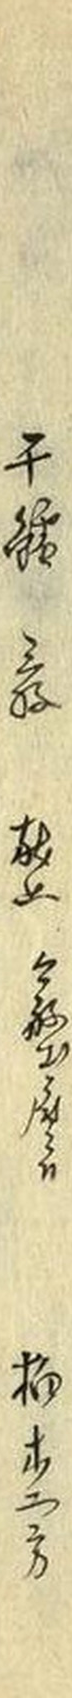干鱈三枚献上今般出府ニ付狛木工方
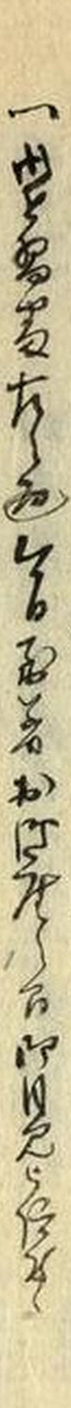一御近習番左之通今日到着於御座之間御目見被仰付候
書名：少傅日録抄（斉承付側向頭取日記、在府）
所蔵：福井県文書館 Fukui Prefectural Archives
